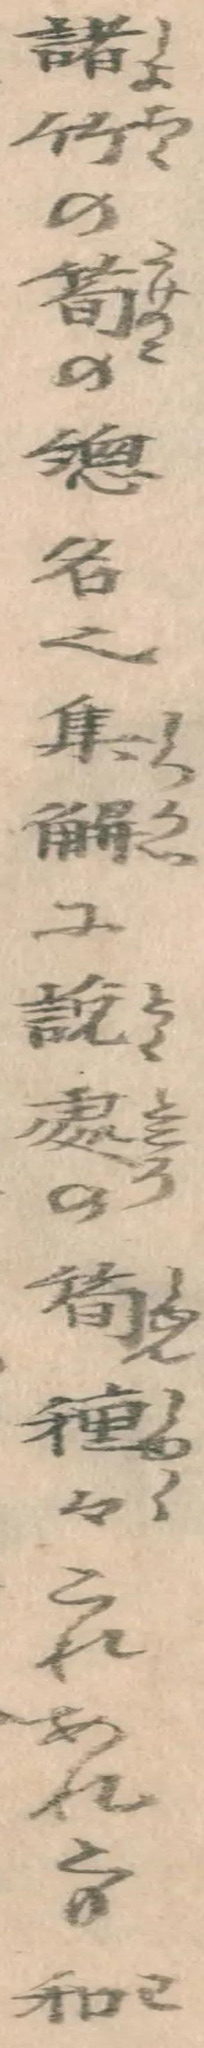諸竹の筍の総名也集解に説処の筍種々これあれとも和
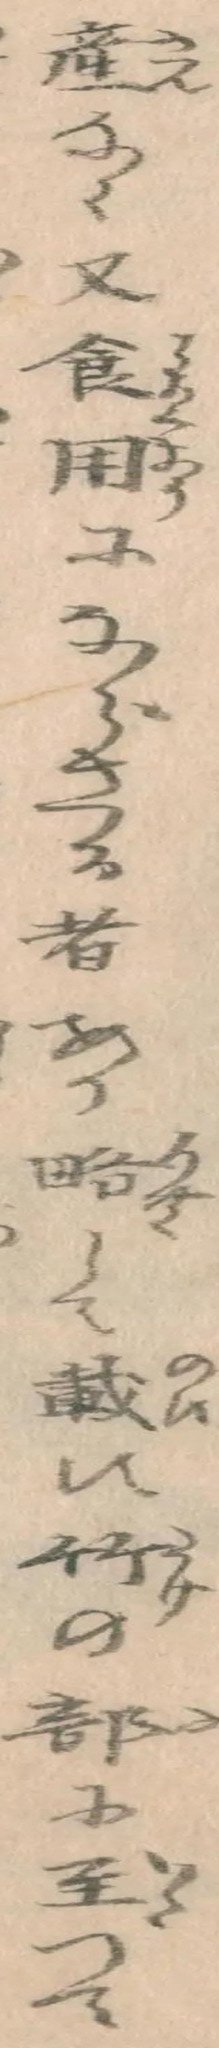産なく又食用にならさる者あり略して載す竹の部に至つて
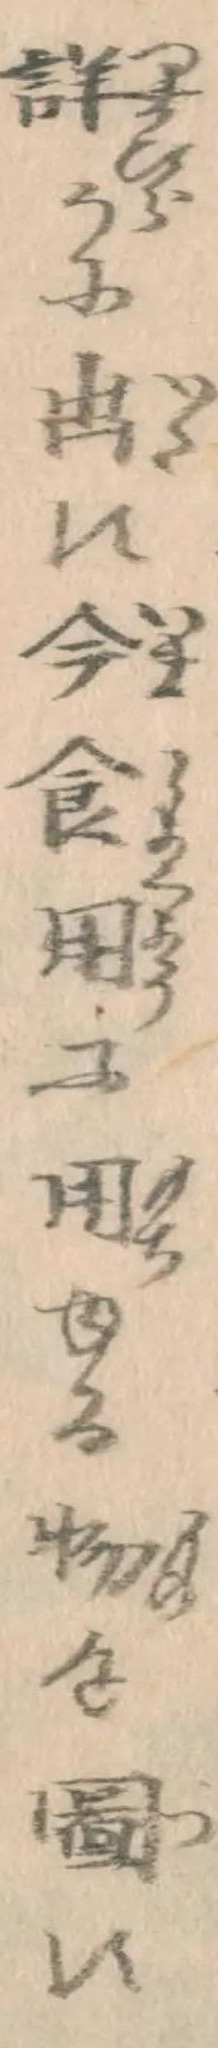詳かに出す今食用に用ゆる物を図す
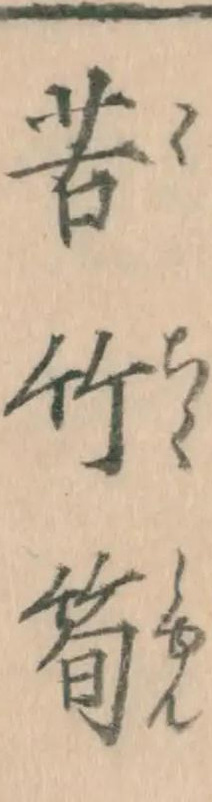苦竹筍
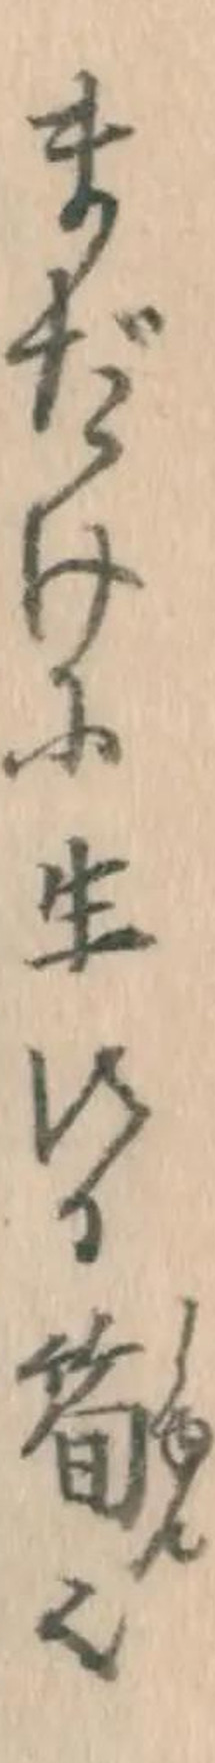まだけに生する筍也
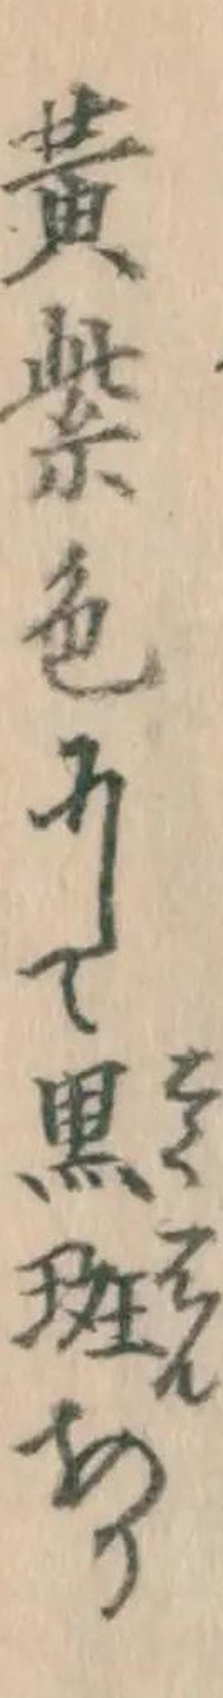黄紫色にして黒斑あり
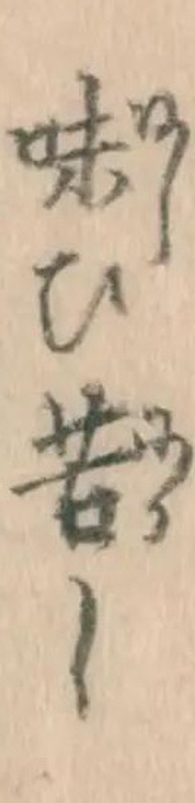味ひ苦し
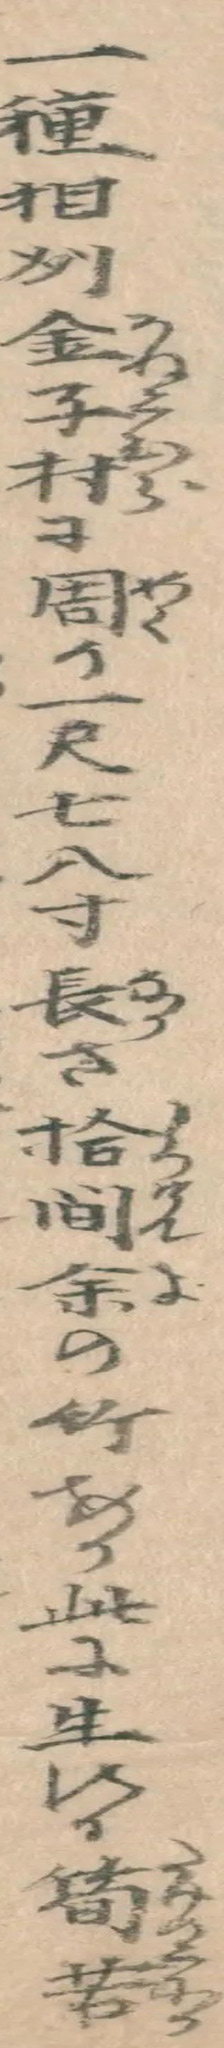一種相州金子村に周り一尺七八寸長さ拾間余の竹あり此に生する筍苦

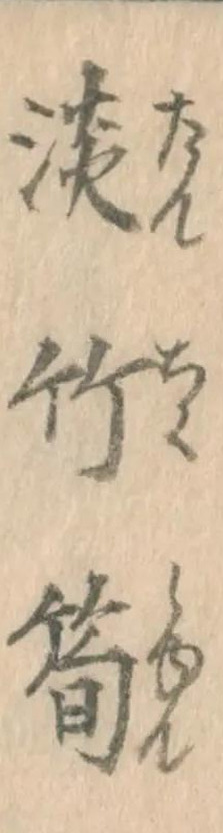淡竹筍
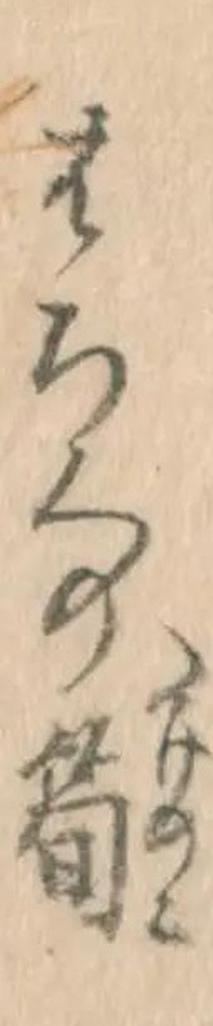はちくの筍
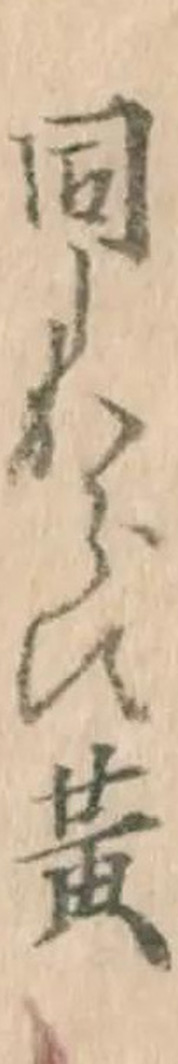同しからす黄
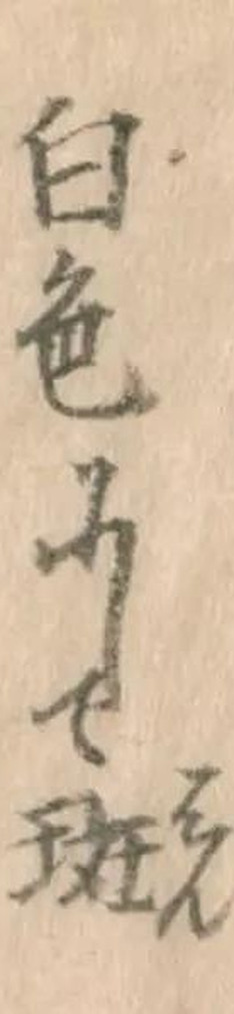白色にして斑
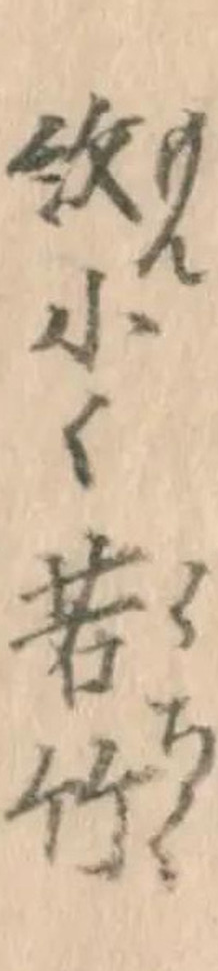紋小く苦竹
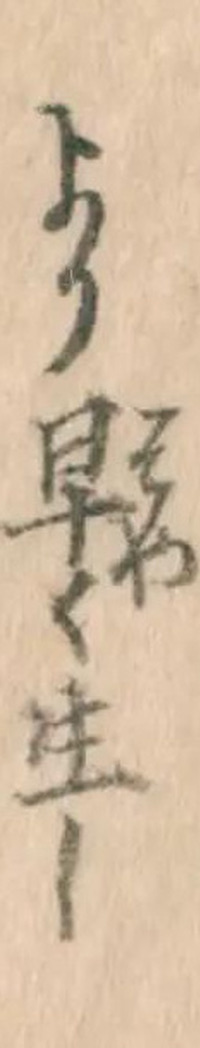より早く生し
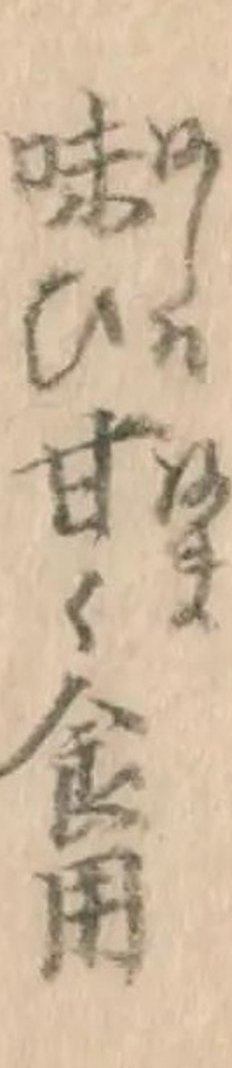味ひ甘く食用
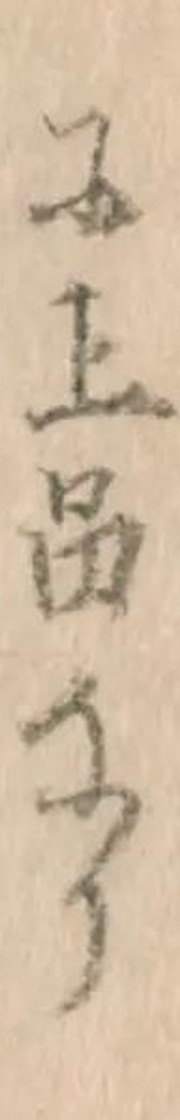に上品なり
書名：本草図譜. 巻52-54
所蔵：国立国会図書館 National Diet Library, JAPAN
